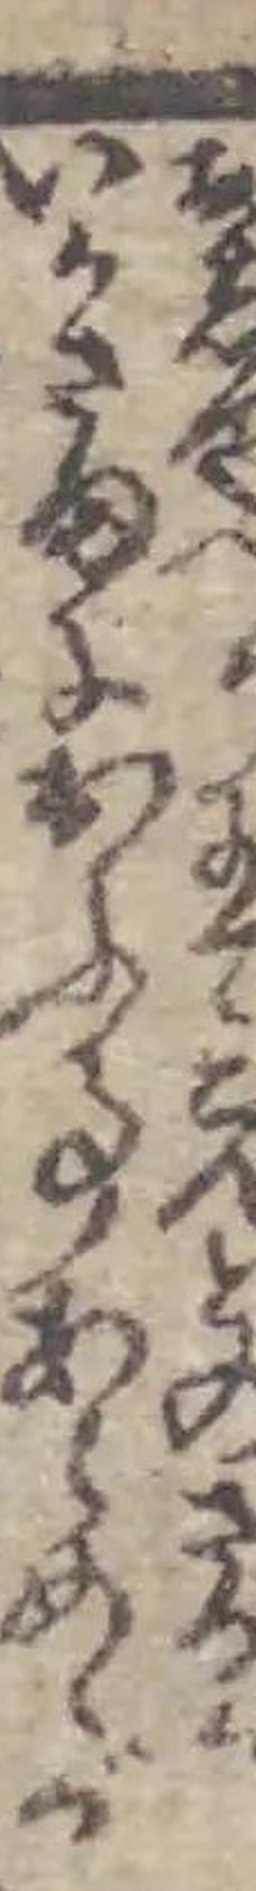いかさまにおふ事あらめゝが
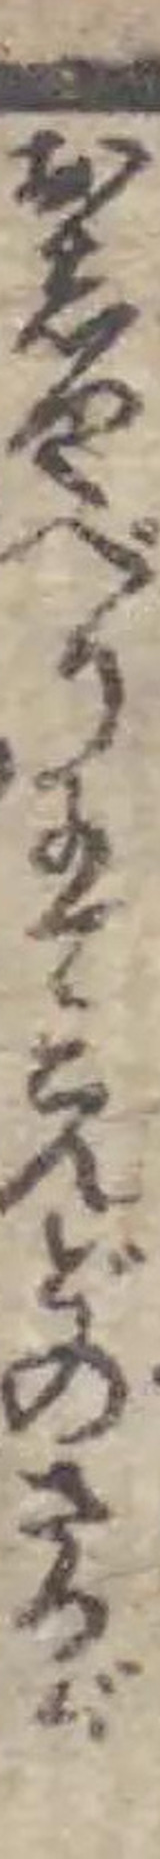おしやべりにてこんどのさるが
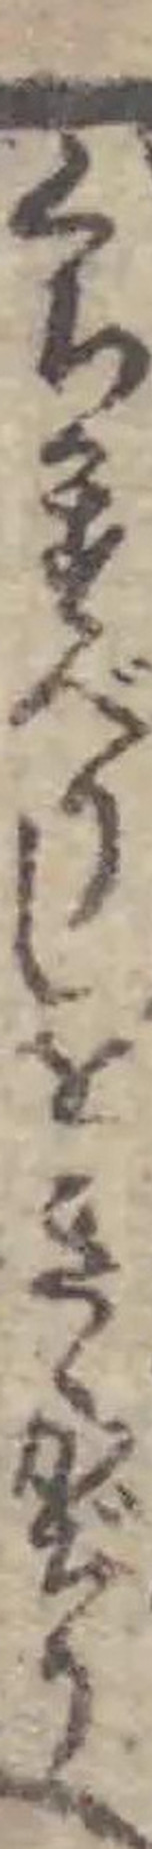くちかすべりしをきゝかぢり
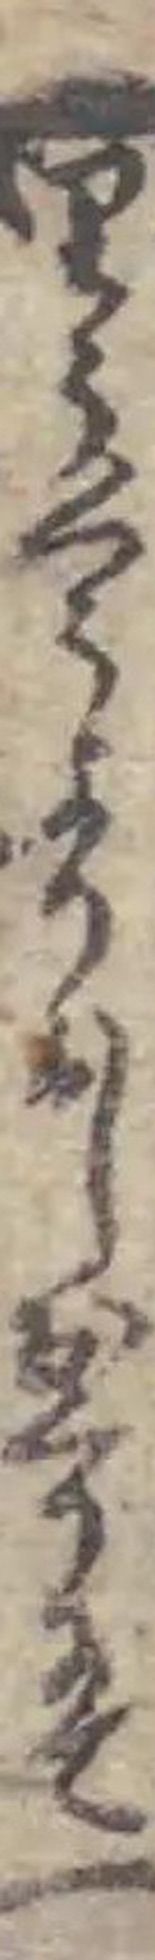りうくうよりおしおくりにて
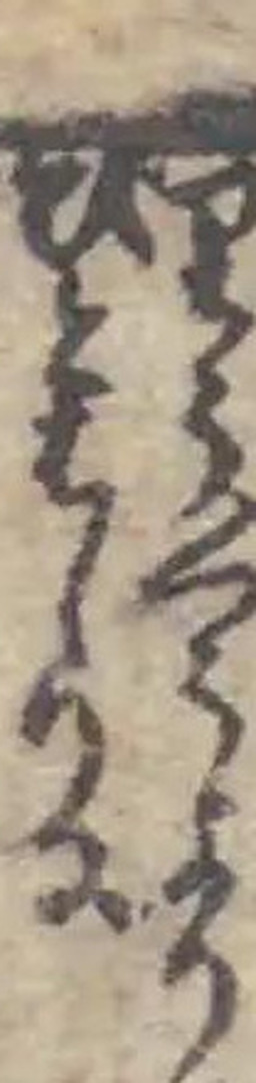ひとはしりに
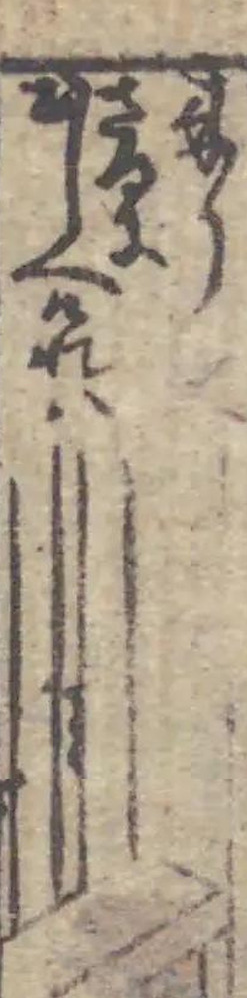おしへけれは
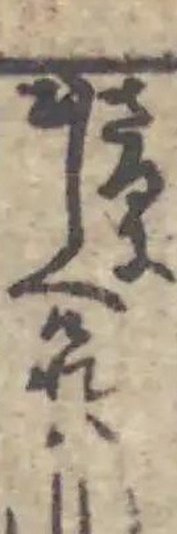さるに
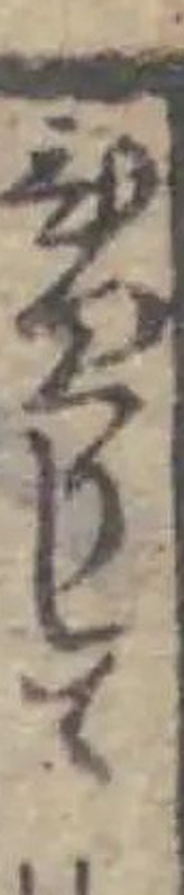ひつくりして
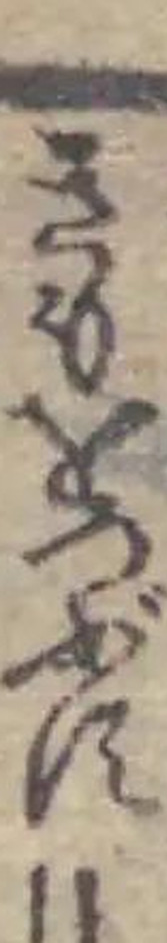きもをつぶす
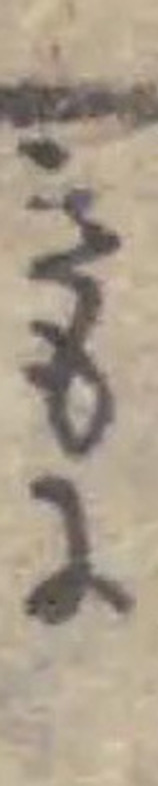きもに
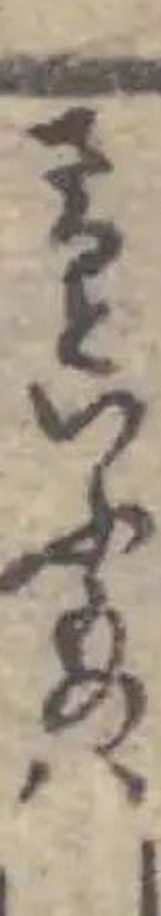さるといふものは
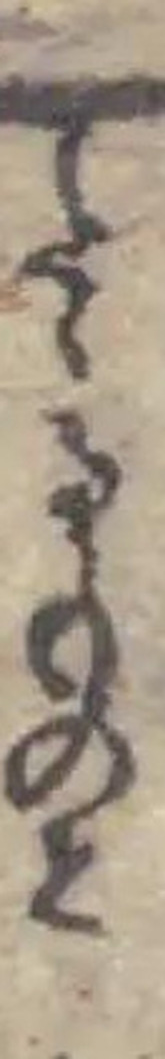たゝるものと

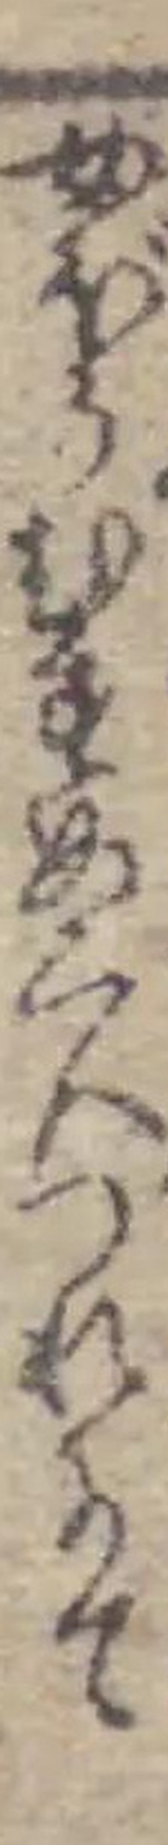女ぼうむすめ二人つてれにて
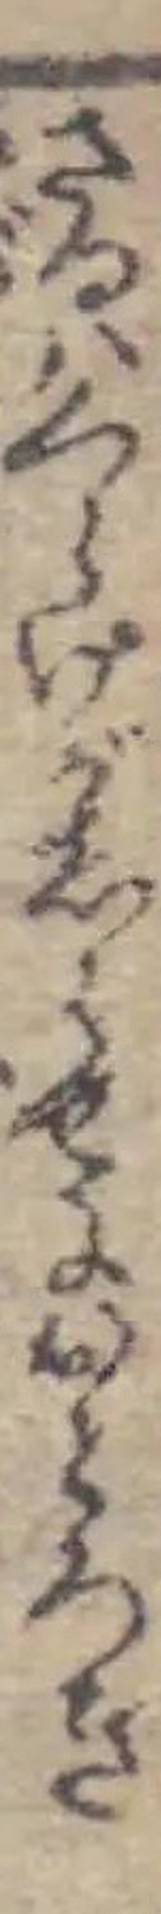さるはくらけがしらせにおとろき
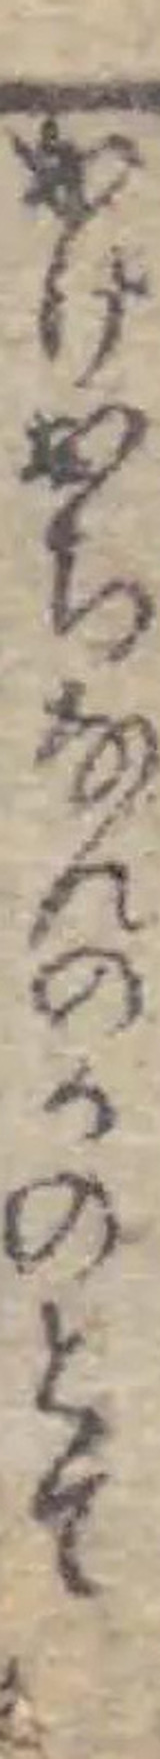かけおちなんのかのとて
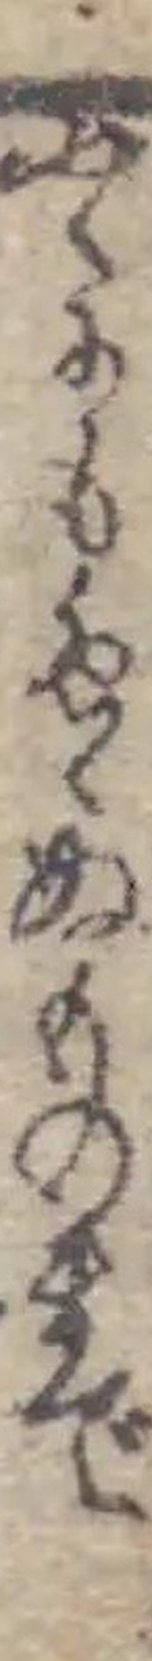やくにもたゝぬものまで
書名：蟹牛房挟多 3巻
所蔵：国立国会図書館 National Diet Library, JAPAN
